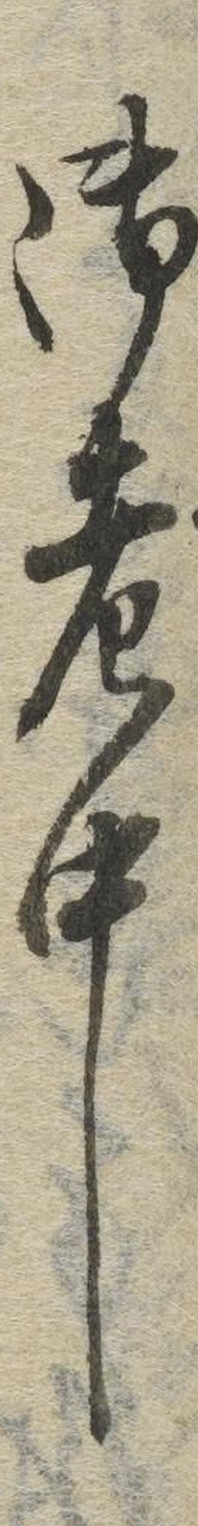御老中
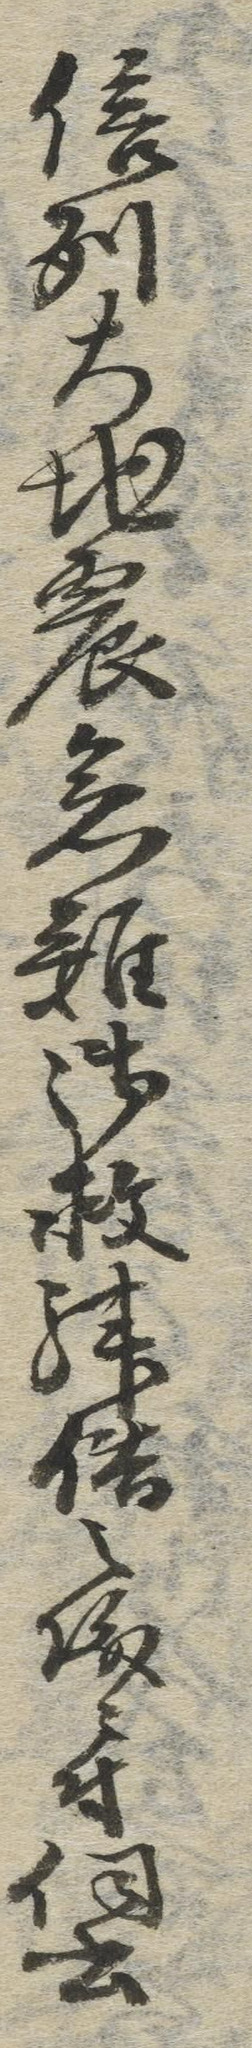信州大地震急難御救拝借之儀二付伺書
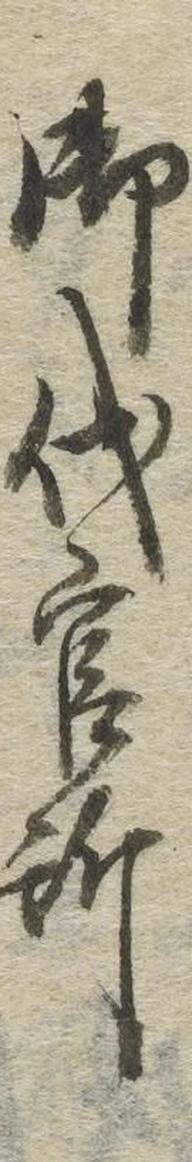御代官所
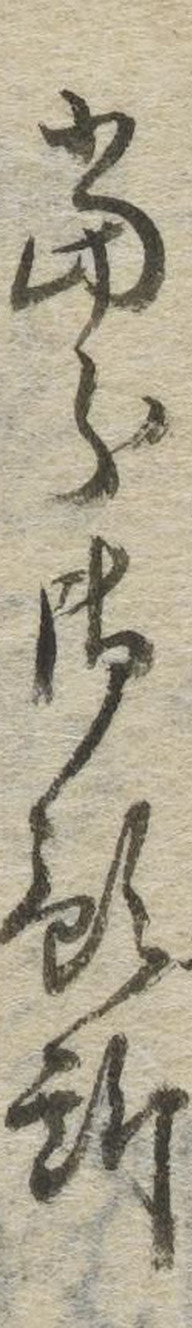当分御預所
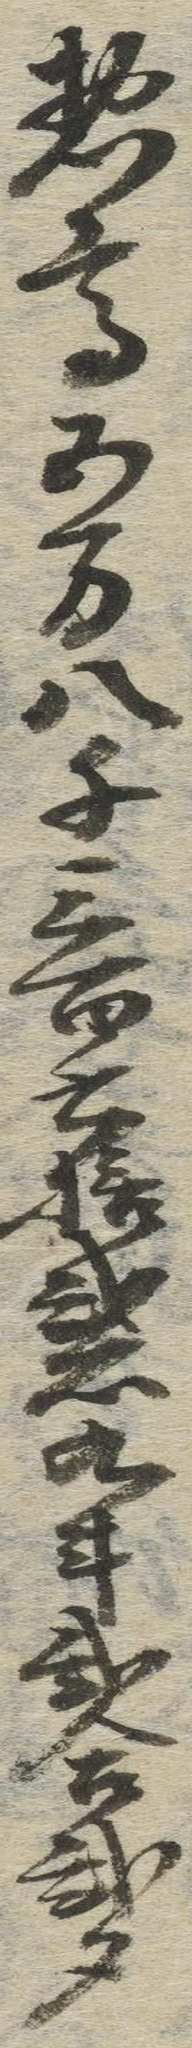惣高五万八千三百六拾弐石九斗弐合弐夕
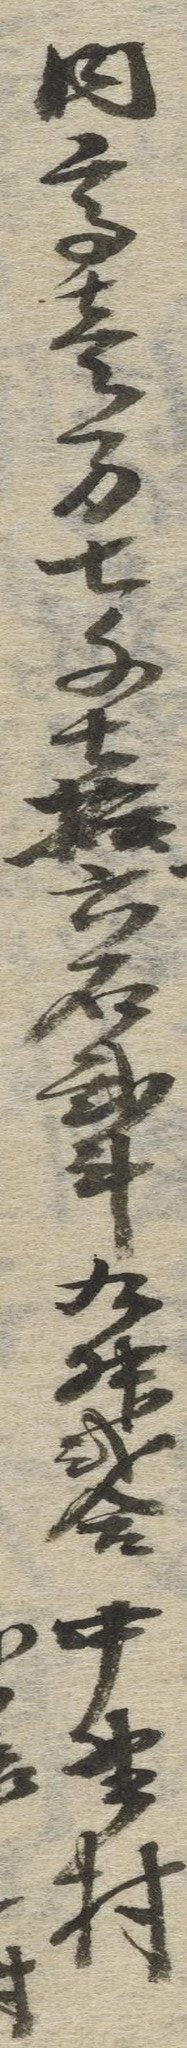内高壱万七千七拾六石弐斗九升弐合中野村
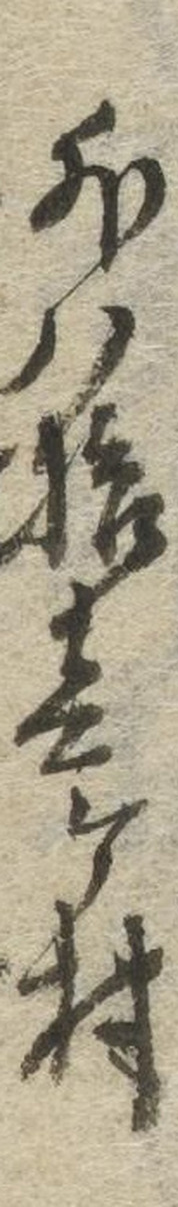外八拾壱ヶ村
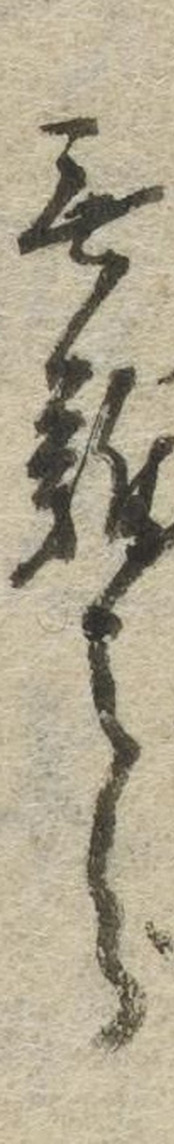無難之分
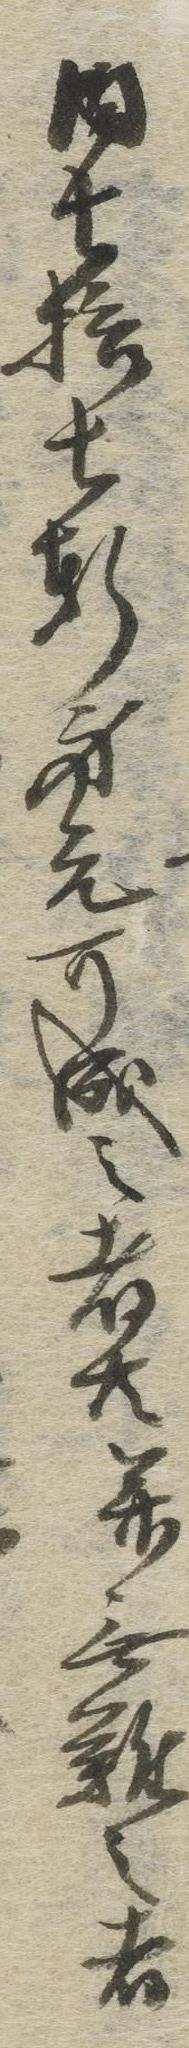内七拾七軒身元可成之者共并無難之者
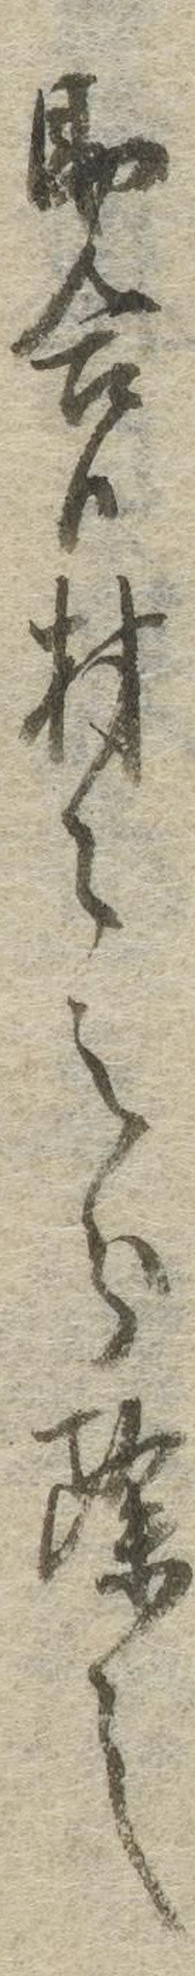助郷候村々之分除之
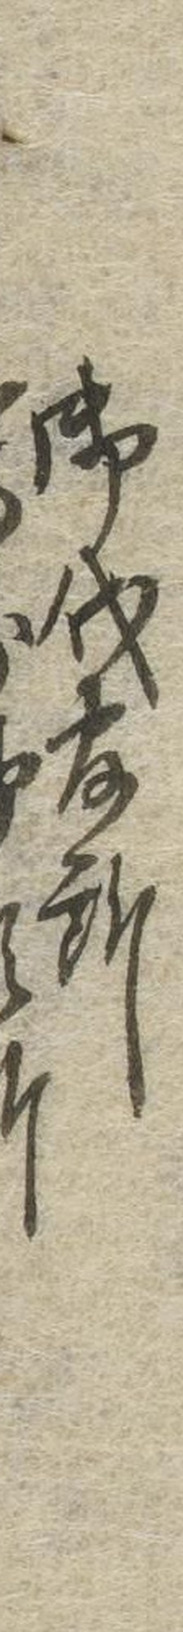御代官所
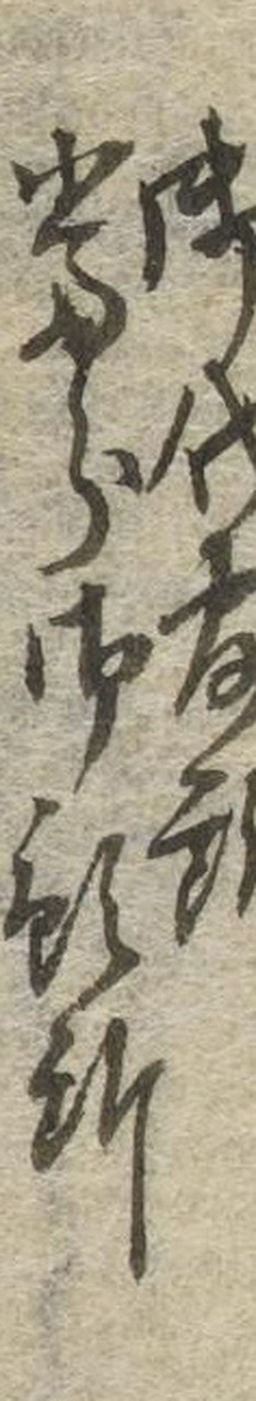当分御預所

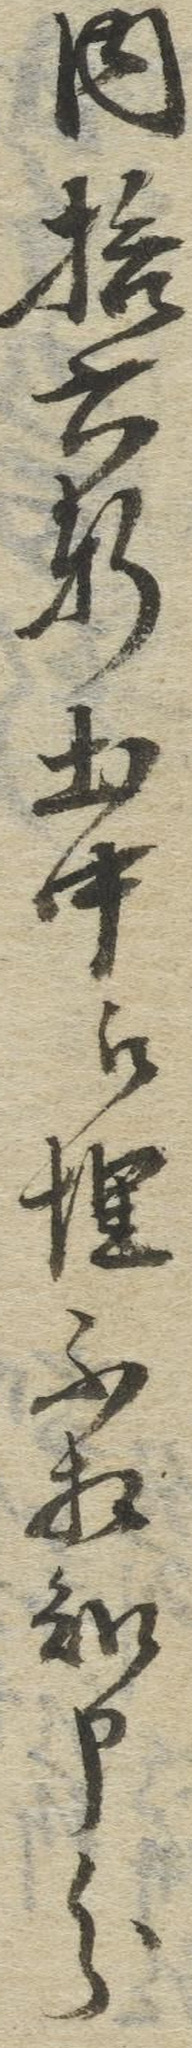内拾六軒土中江埋不相知申分
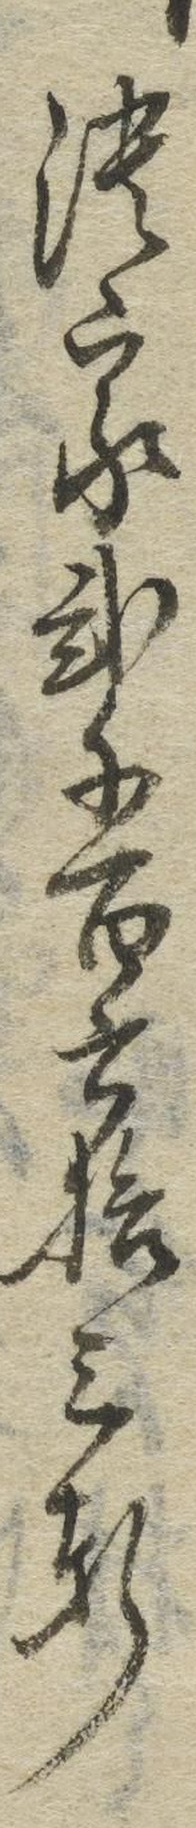潰家弐千百六拾三軒
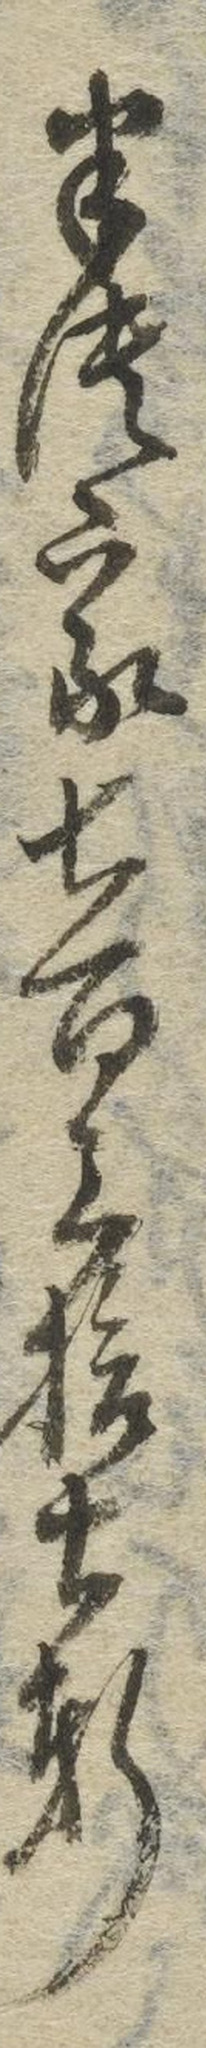半潰家七百三拾七軒
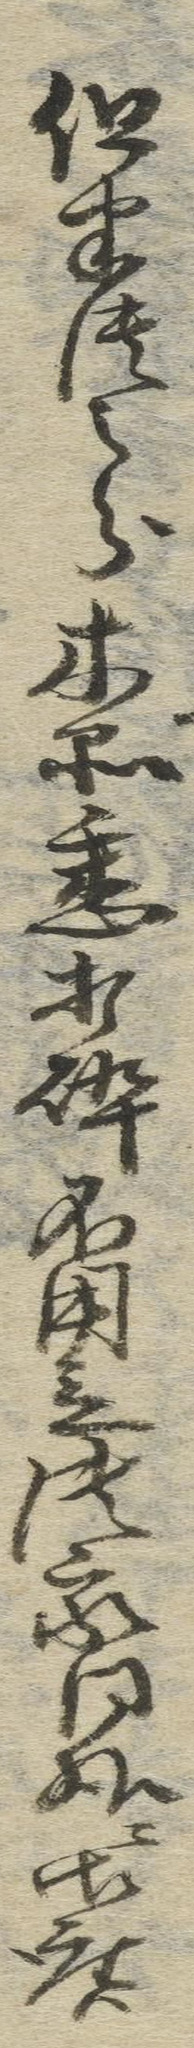但半潰之分木品悉打砕不用立潰家同様二御座候
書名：信濃越後　地震書留
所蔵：東京大学地震研究所図書室 Earthquake Research Institute Library, The University of Tokyo, JAPAN
